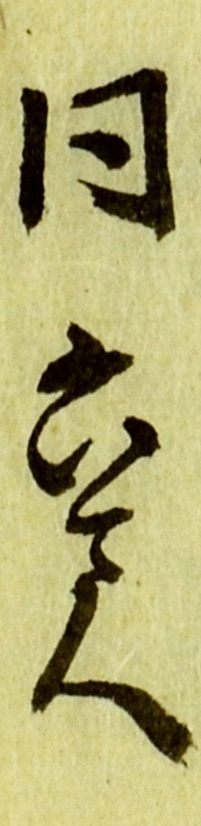同六尺
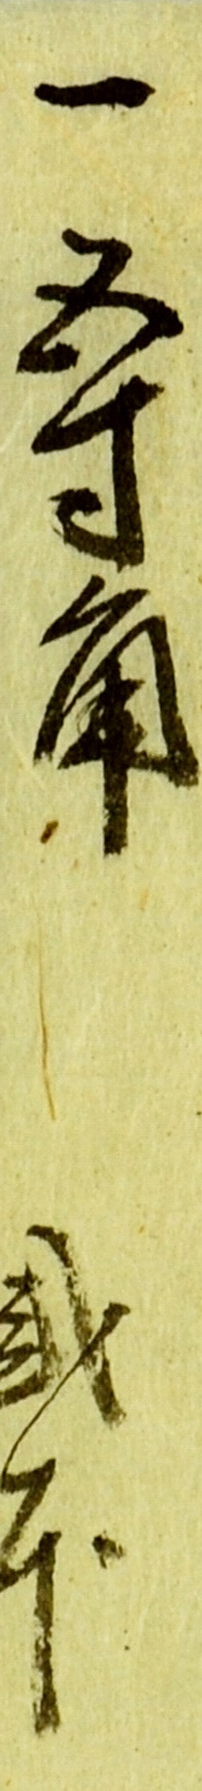一五寸角弐本
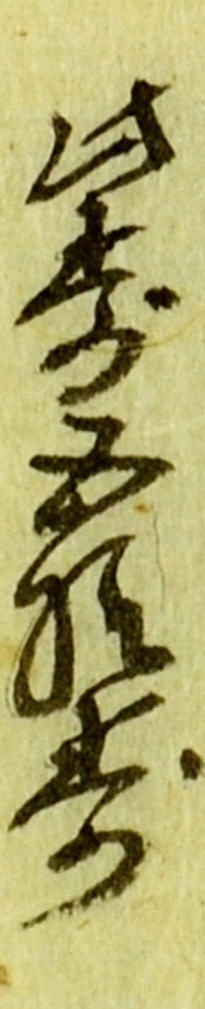此歩五拾歩
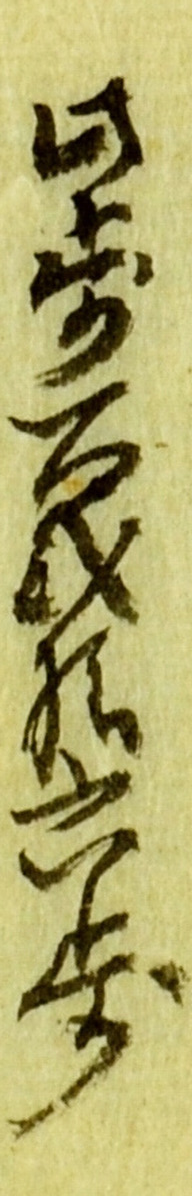此歩百弐拾六歩

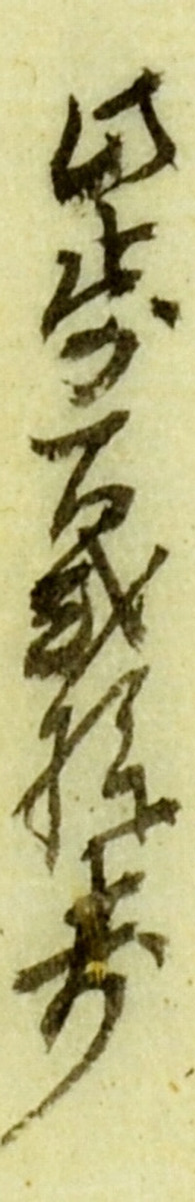此歩百弐拾歩
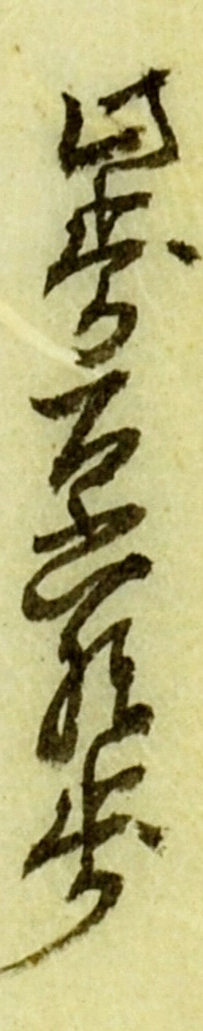此歩百六拾歩
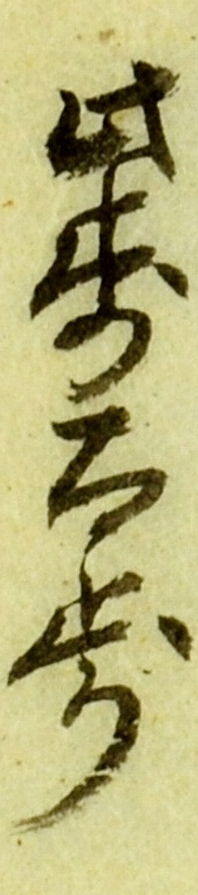此歩百歩
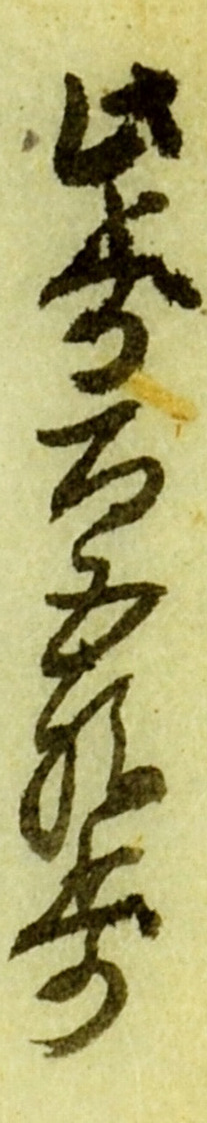此歩百五拾歩
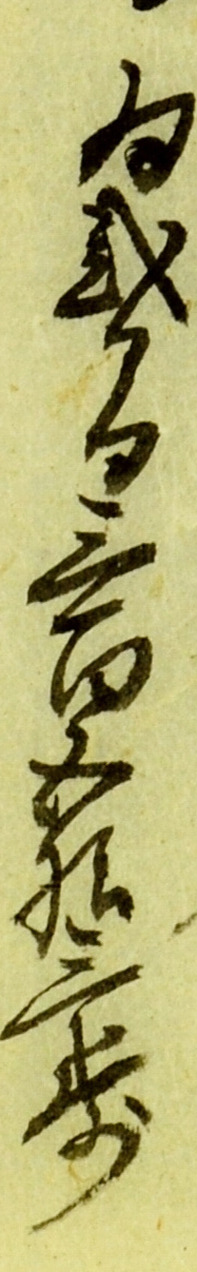為弐間三百五拾三歩
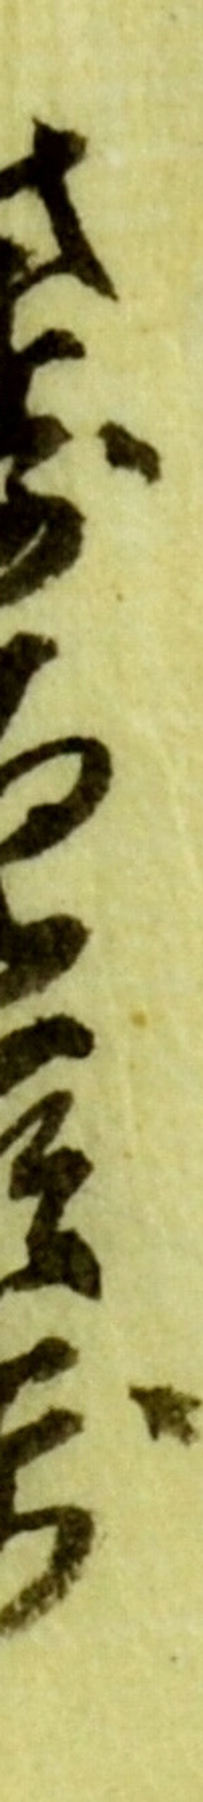此歩百六拾歩

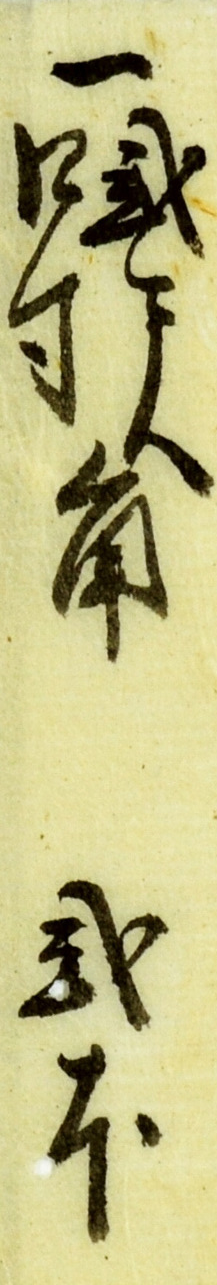一六寸角弐本
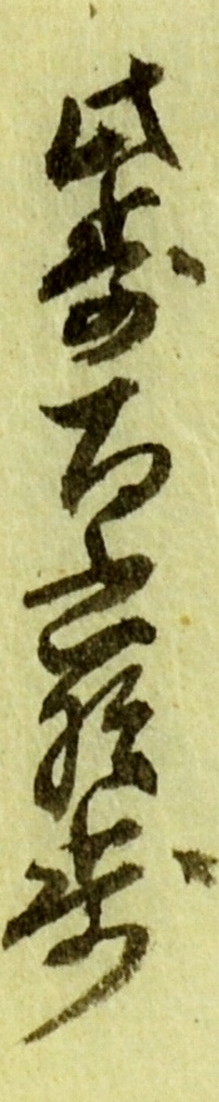此歩百六拾歩
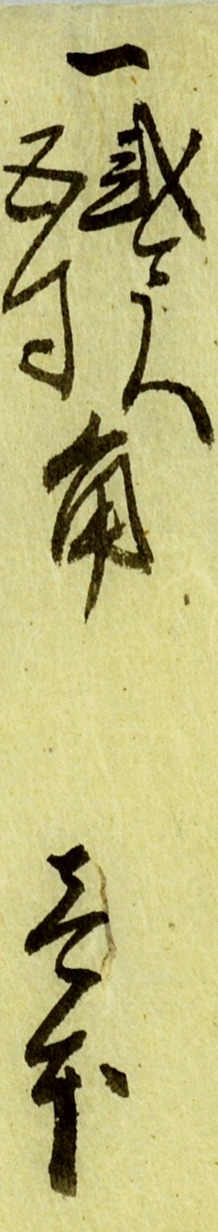一八寸角壱本
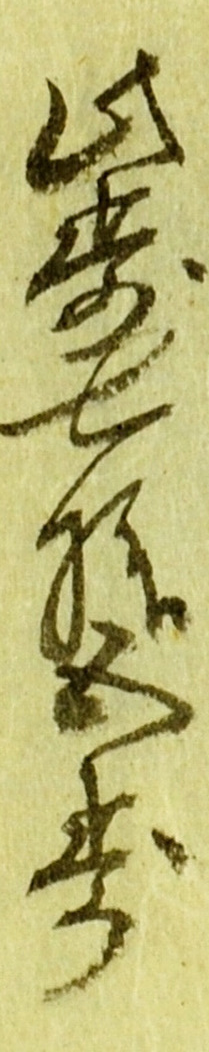此歩七拾五歩
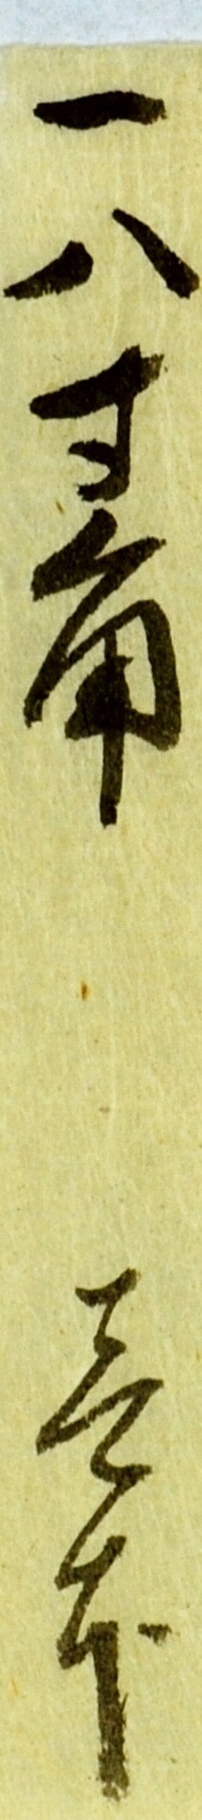一八寸角壱本
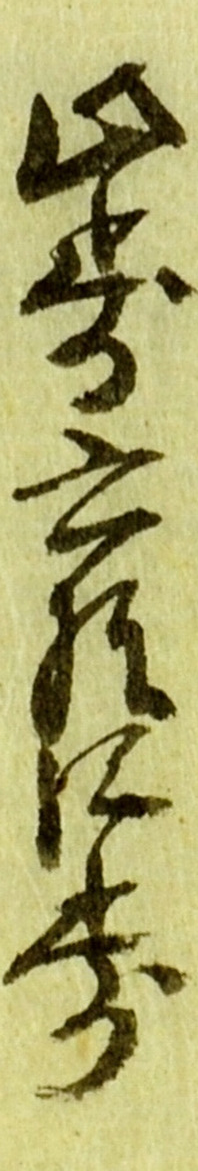此歩六拾四歩
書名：材木川下ケ分一上納帳
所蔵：伊那市立高遠町図書館・合同会社AMANE
